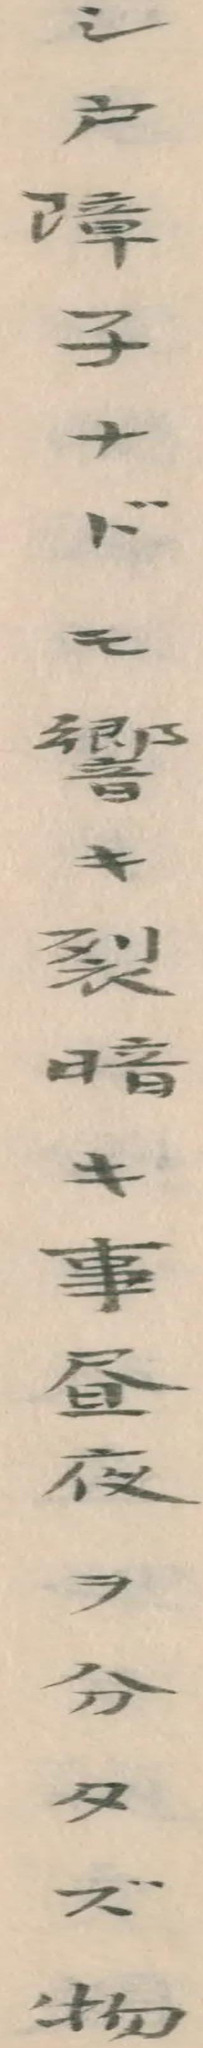シ戸障子ナドモ響キ裂暗キ事昼夜ヲ分タズ物
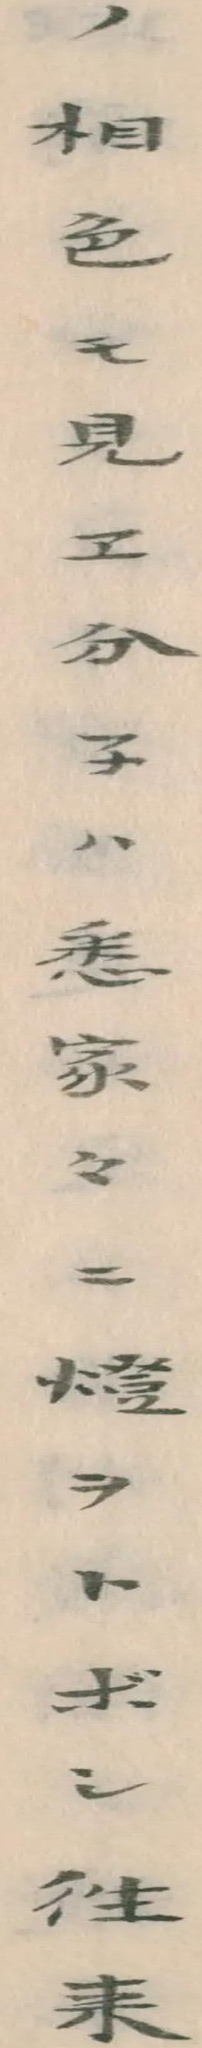ノ相色モ見ヱ分ネハ悉家々ニ燈ヲトボシ往来
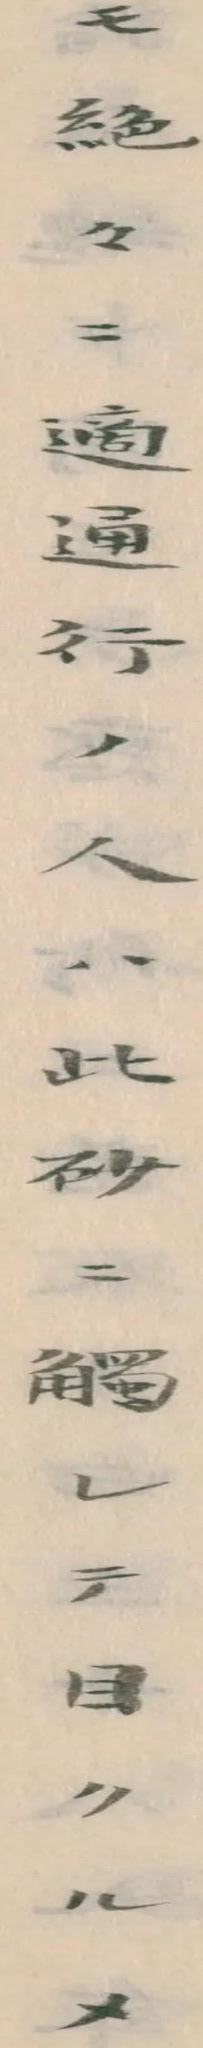モ絶々ニ適通行ノ人ハ此砂ニ觸レテ目クルメ
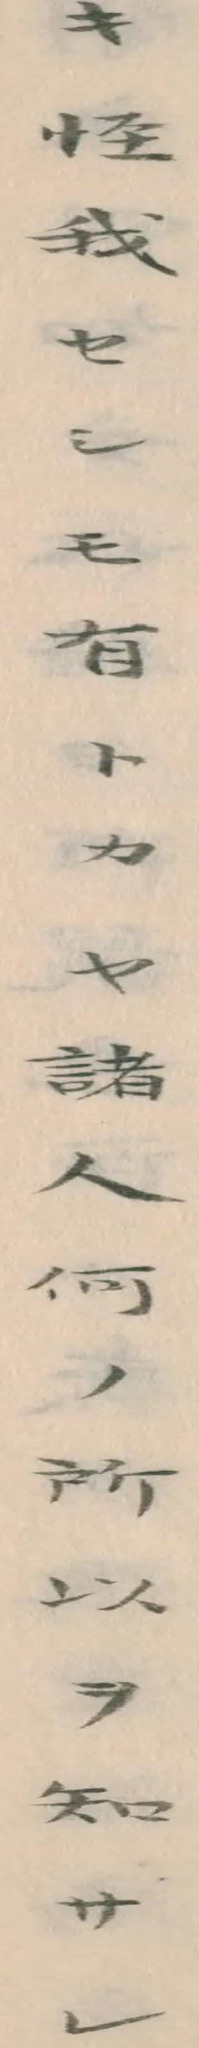キ怪我セシモ有トカヤ諸人何ノ所以ヲ知サレ
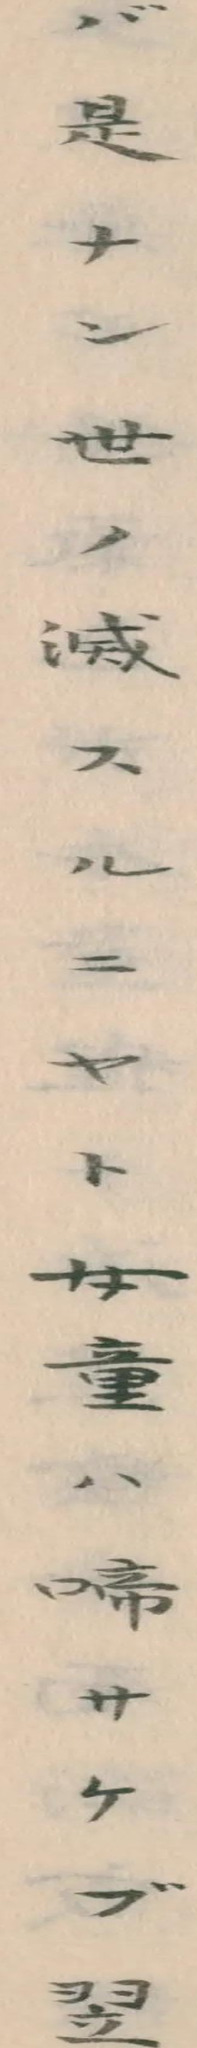バ是ナン世ノ滅スルニヤト女童ハ啼サケブ翌
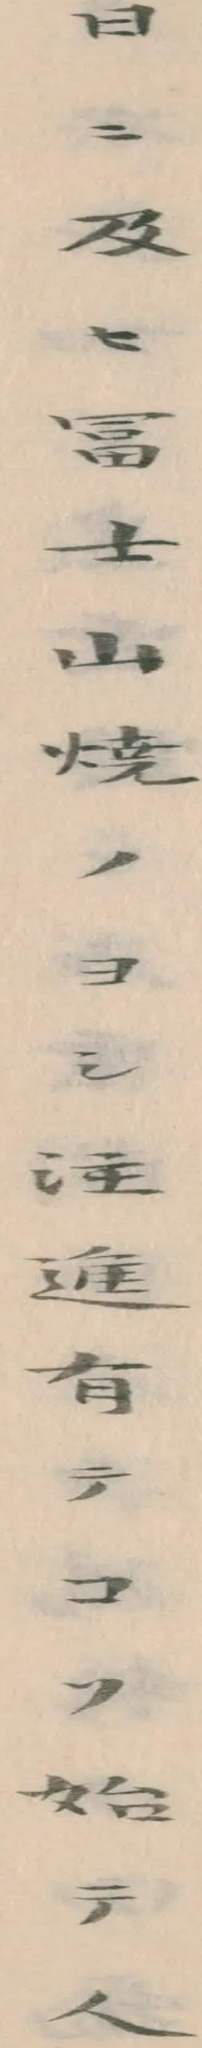日ニ及ヒ冨士山焼ノヨシ注進有テコソ始テ人
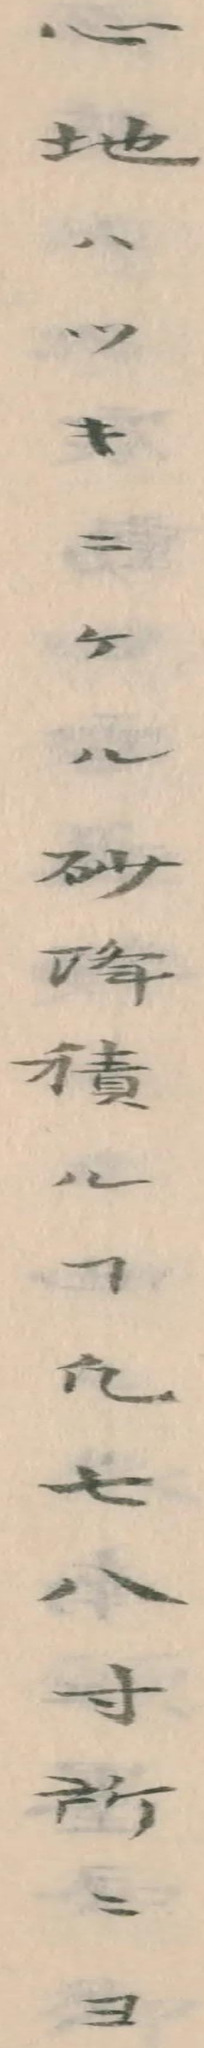心地ハツキニケル砂降積ルコト凡七八寸所ニヨ
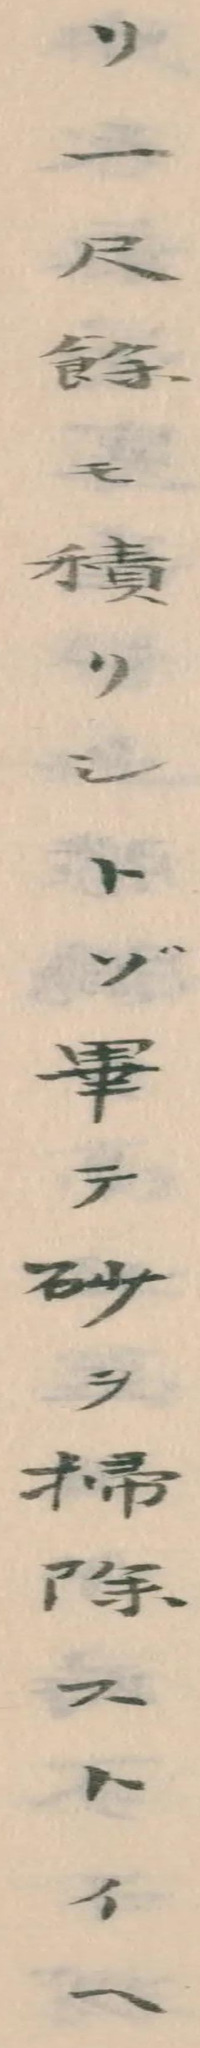リ一尺餘モ積リシトゾ畢テ砂ヲ掃除ストイヘ
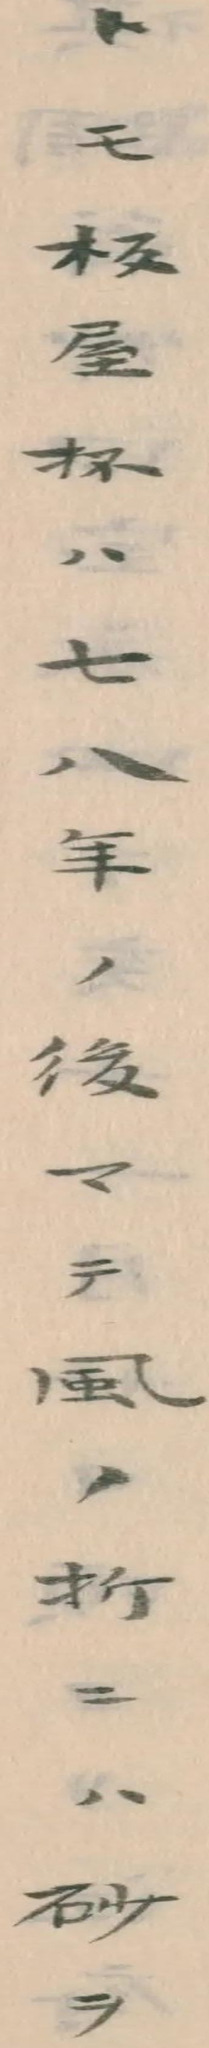トモ板屋杯ハ七八年ノ後マテ風ノ折ニハ砂ヲ
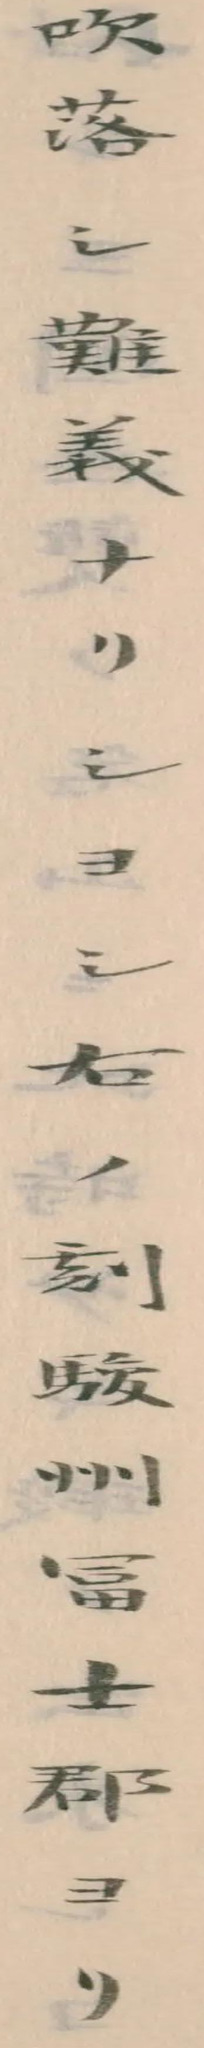吹落シ難義ナリシヨシ右ノ刻駿州冨士郡ヨリ
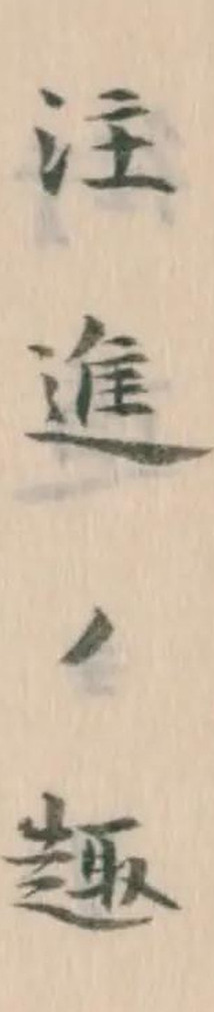注進ノ趣
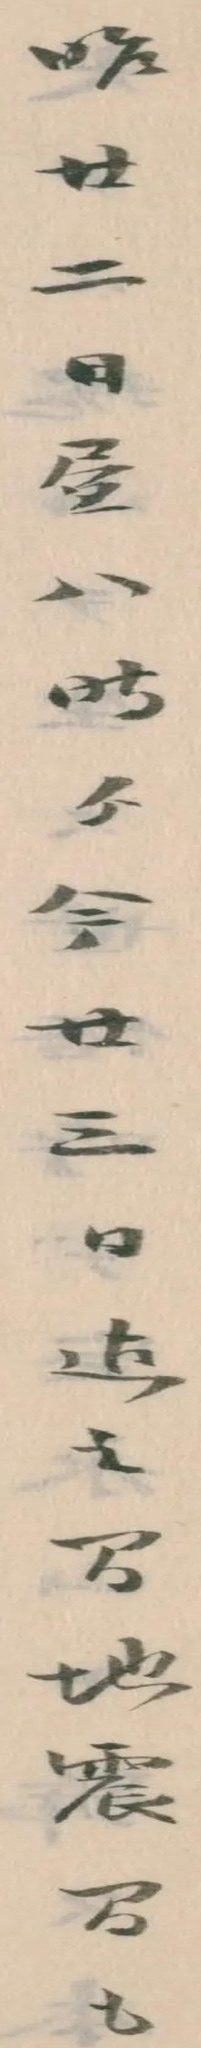咋廿二日昼八時ゟ今廿三日迄之間地震間も
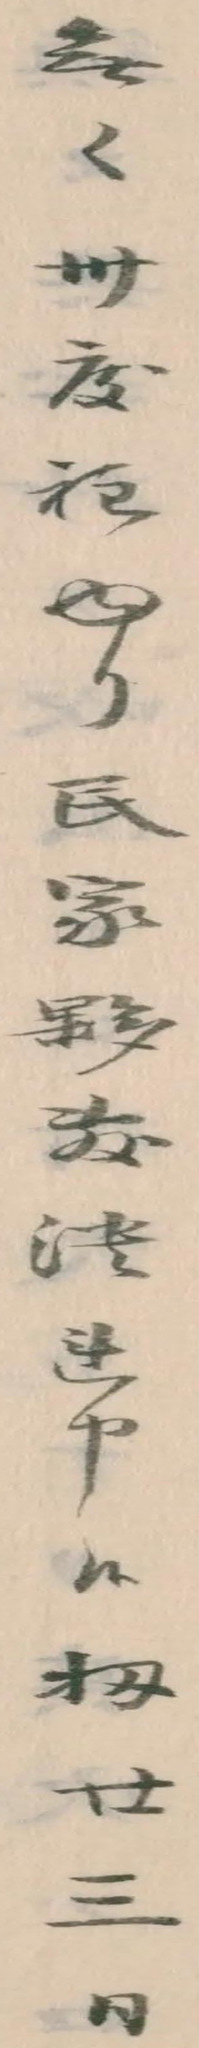無く卅度程ゆり民家夥敷潰れ申候扨廿三日
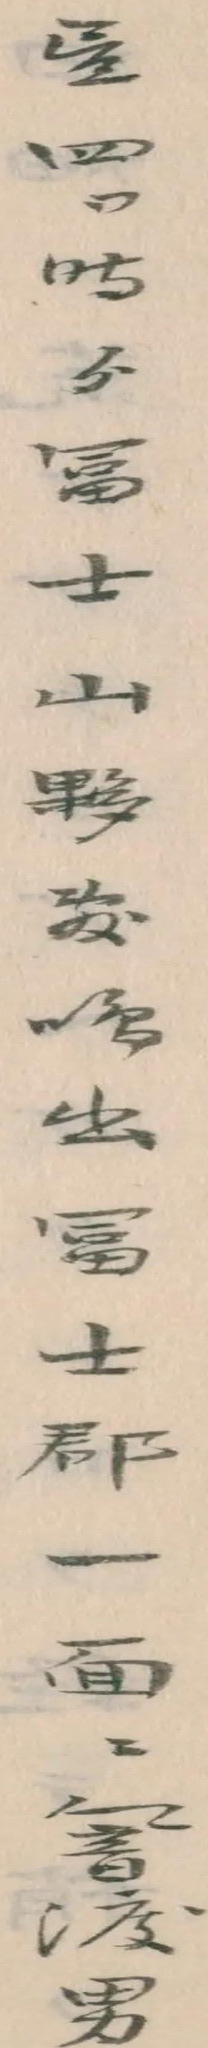昼四ッ時ゟ冨士山夥敷鳴出冨士郡一面に響渡男
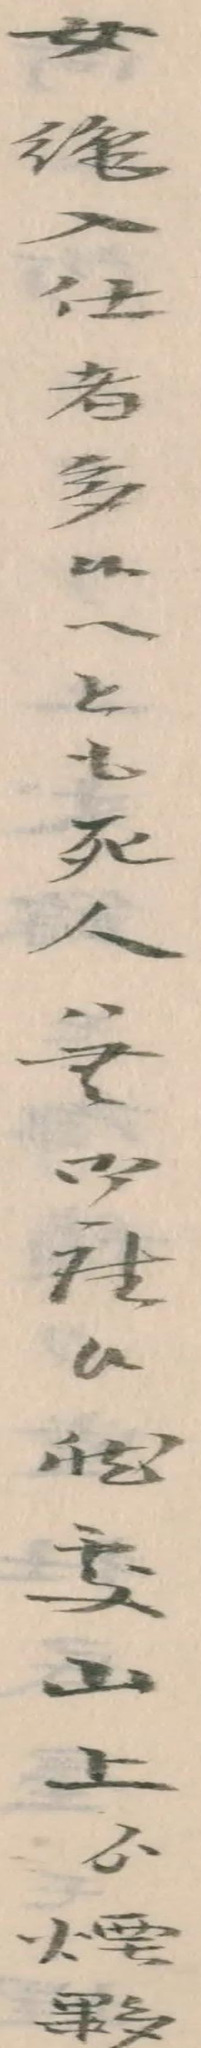女絶入仕者多候へとも死人は無御座候然處山上ゟ煙夥
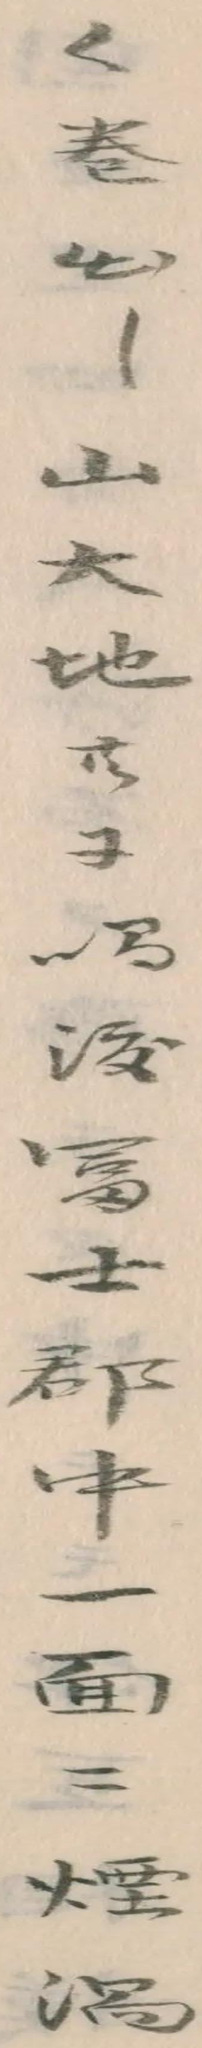く巻出し山大地共に鳴渡冨士郡中一面に煙渦
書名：地災撮要. 巻11-12(地震之部)
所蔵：国立国会図書館 National Diet Library, JAPAN
